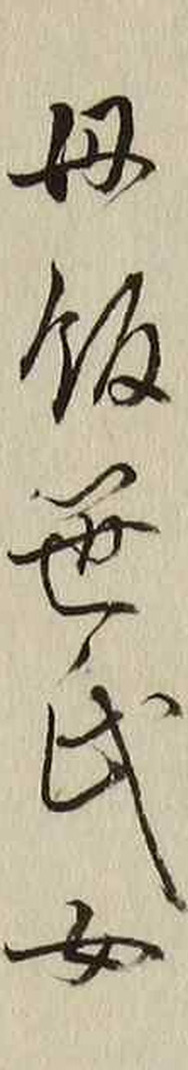母飯笹氏女
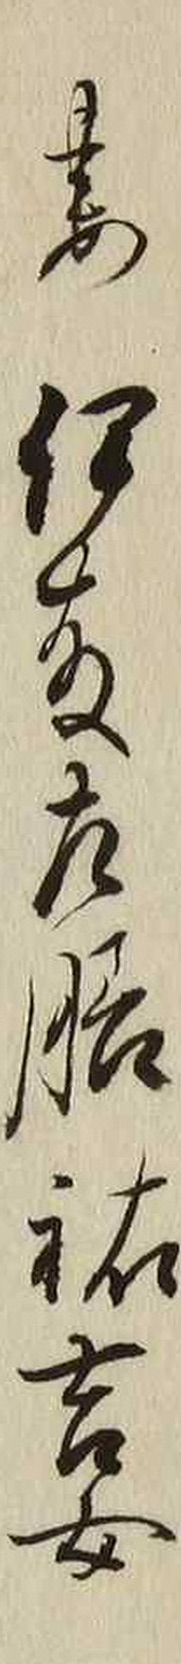妻伊藤左膳祐玄女
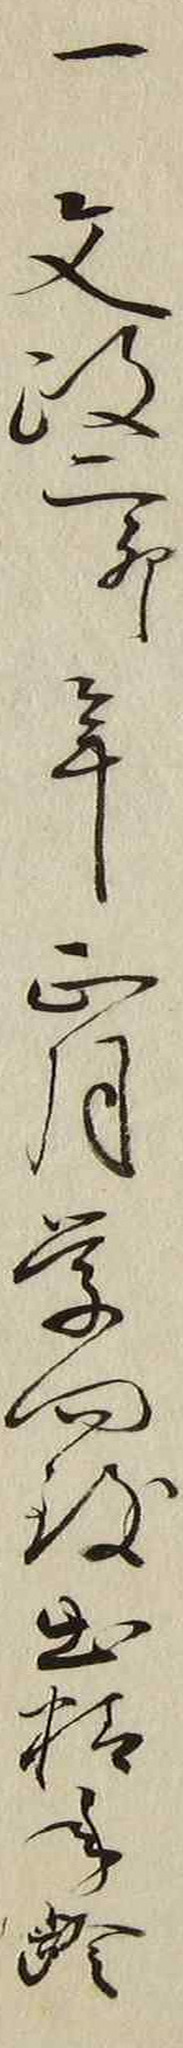一文政二卯年正月学問致出精年齢
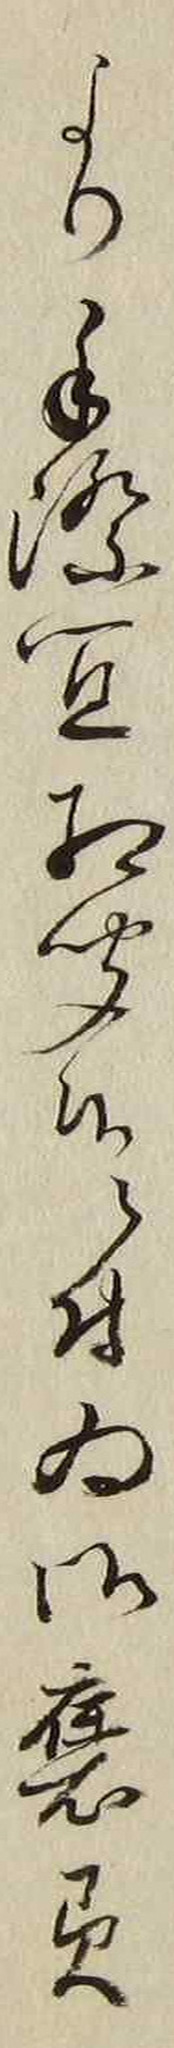より手際宜相聞候に付為御褒美
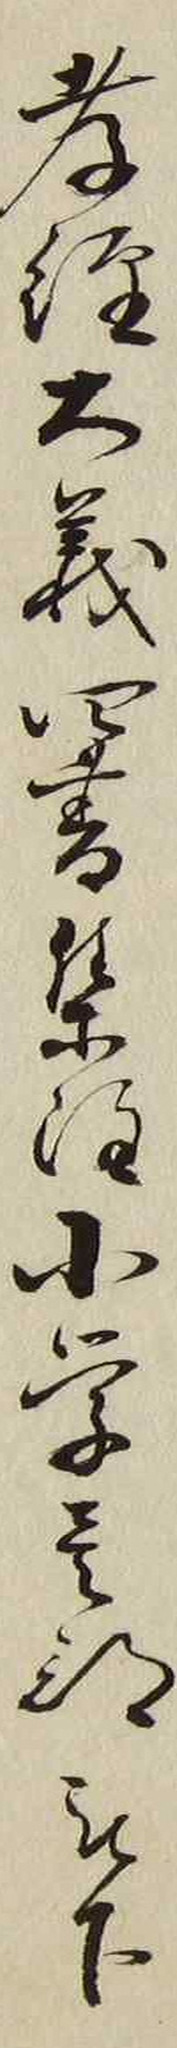孝経大義四書集注小学壱部被下
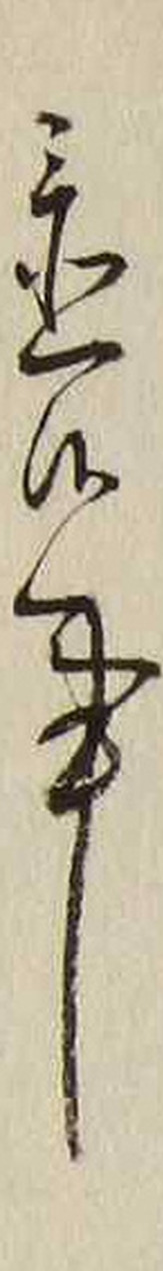置候事

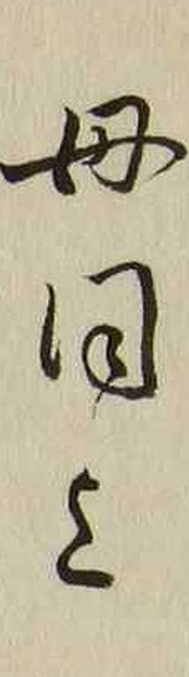母同上
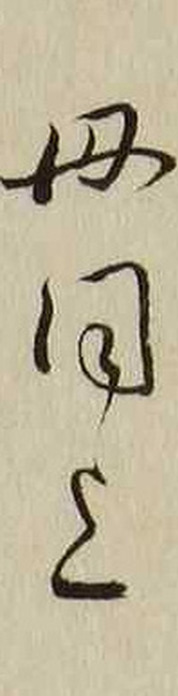母同上
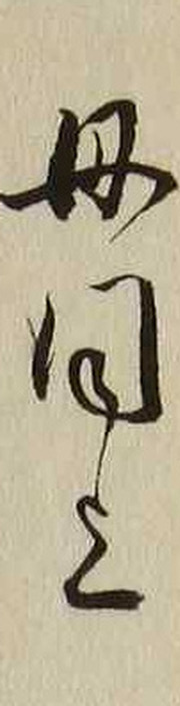母同上
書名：諸士系譜　巻之1　い之部1
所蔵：会津若松市立会津図書館
